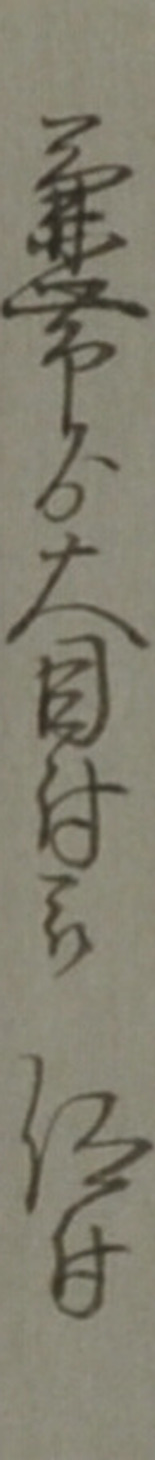兼帯ゟ大目付被仰付
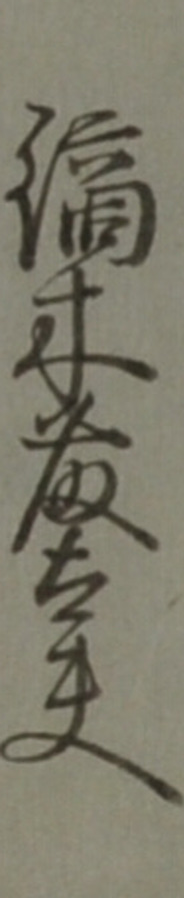鏑木藤太夫
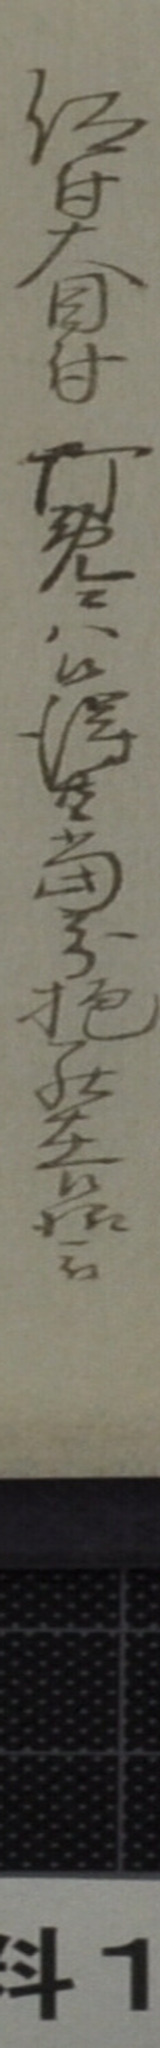仰付大目付御免ニハ候得共当分抱罷在候様被
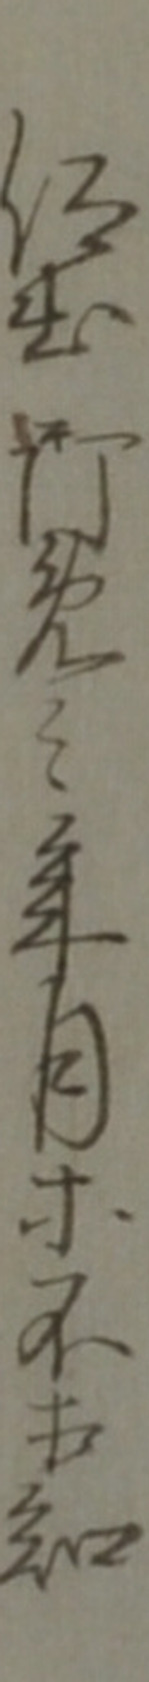仰出御免之年月等不相知
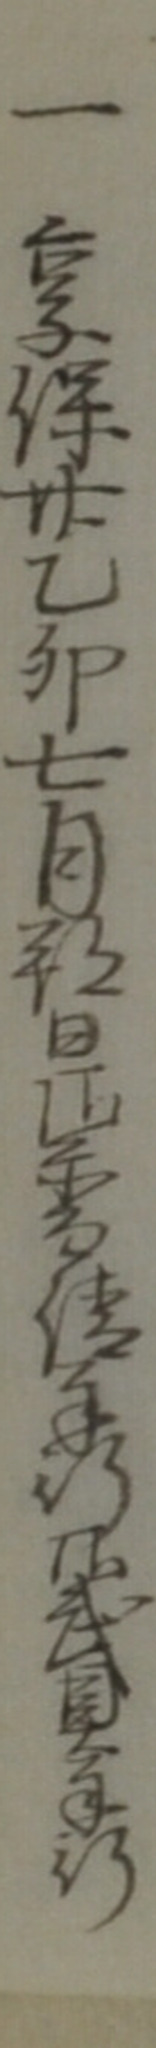一享保廿乙卯七月朔日御普請奉行御武具奉行
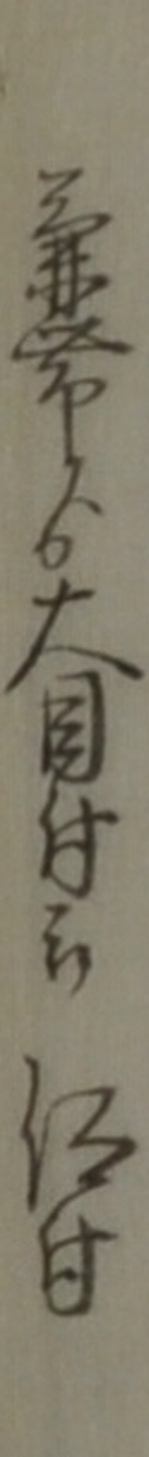兼帯ゟ大目付被仰付
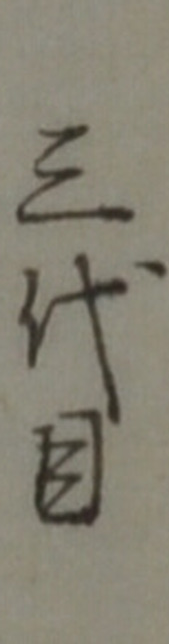三代目
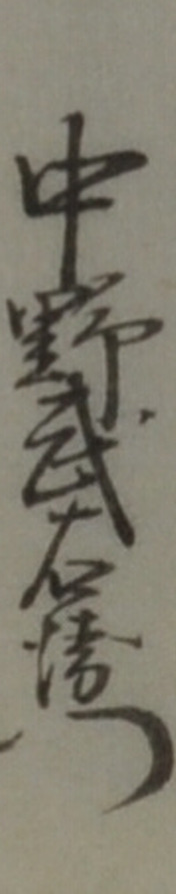中野武右衛門
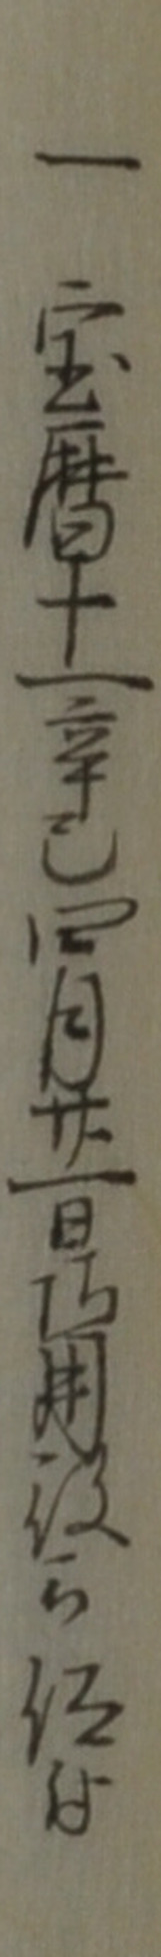一宝暦十一辛巳四月廿一日御用役被仰付
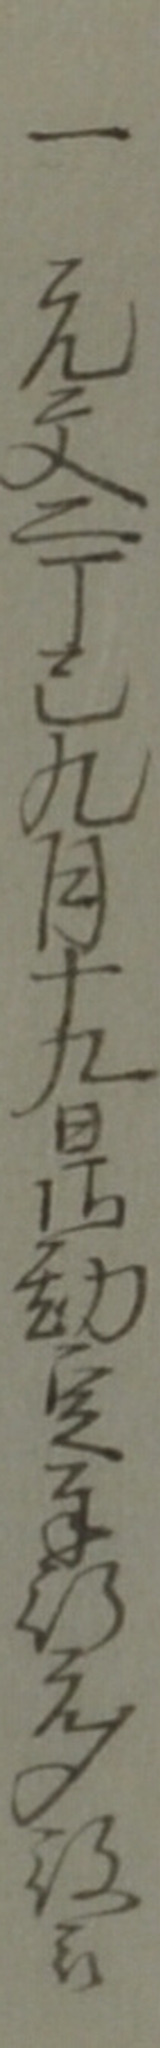一元文二丁巳九月十九日御勘定奉行元〆役被
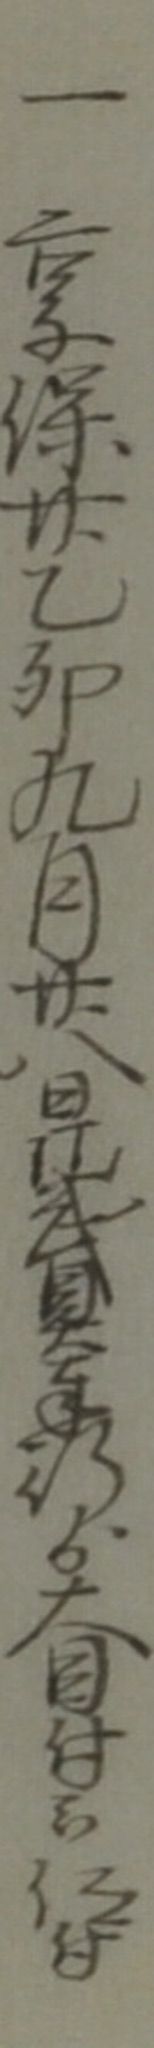一享保廿乙卯九月廿八日御武具奉行ゟ大目付被仰付
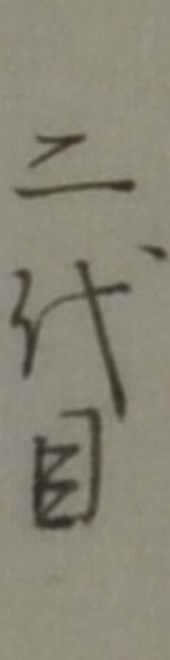二代目
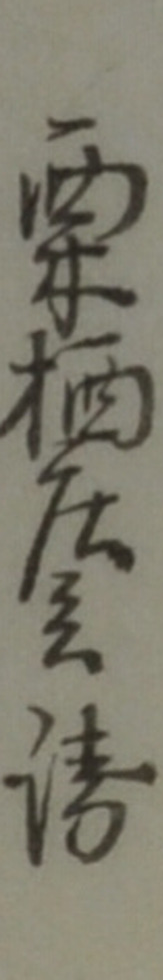栗栖庄兵衛
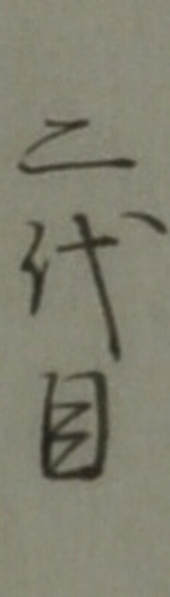二代目
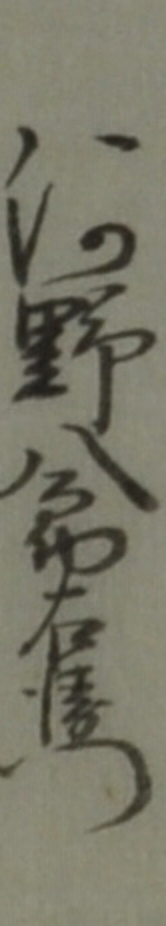河野八郎右衛門
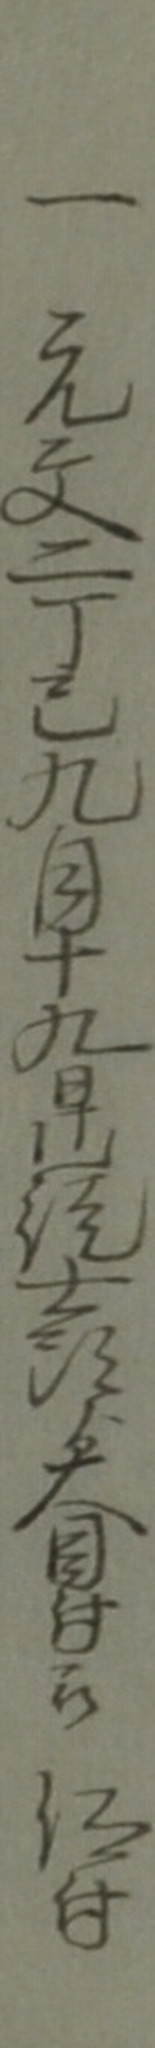一元文二丁巳九月十九日御徒士頭ゟ大目付被仰付
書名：諸御役代々録（三）
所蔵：伊那市立高遠町図書館・合同会社AMANE
